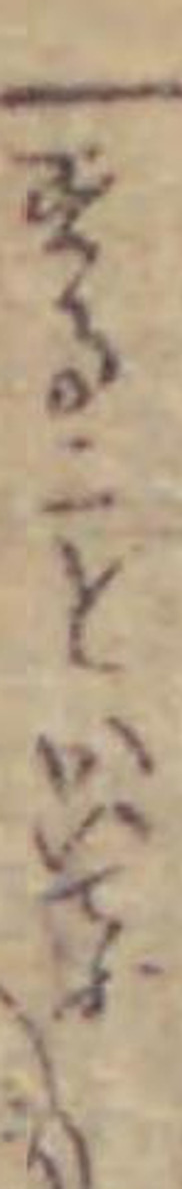することかいてふ
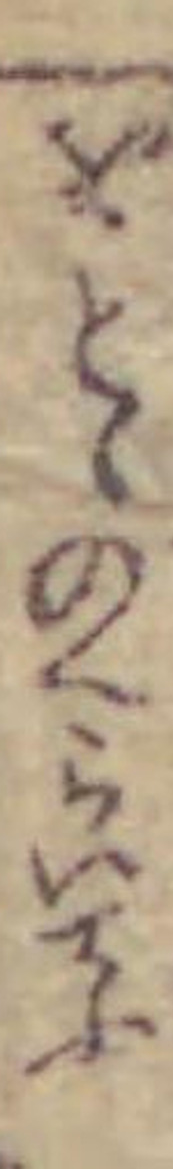をとゝのへらいてふ
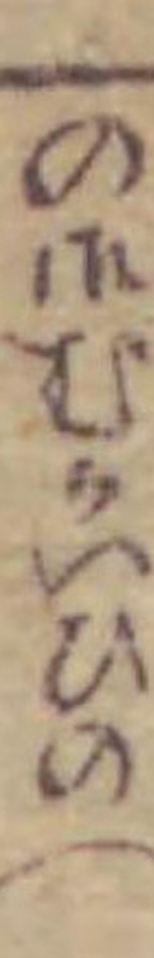の御むかいひの
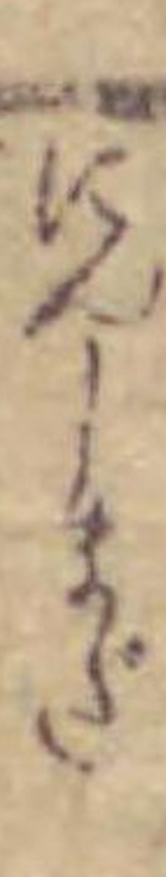にんしまだ
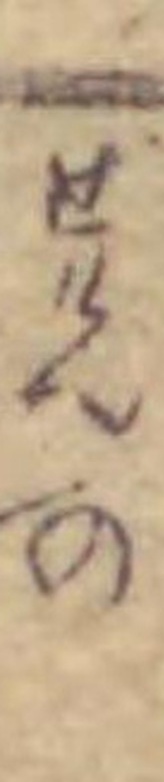ぜけんの
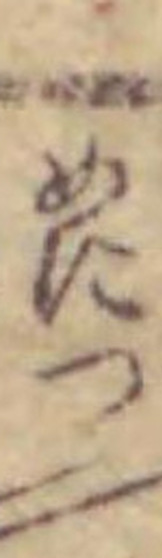めにつ
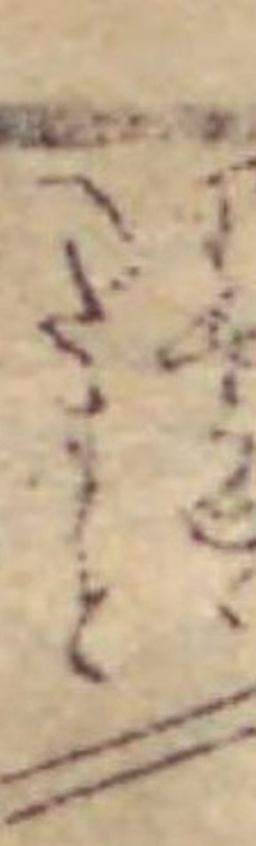へだすと
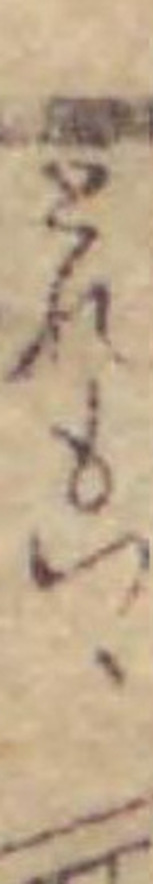とれもいゝ
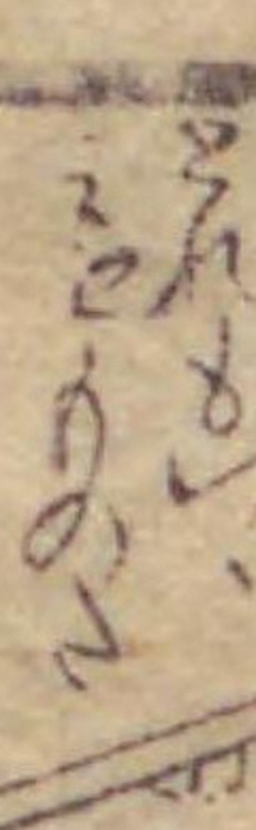みせものた
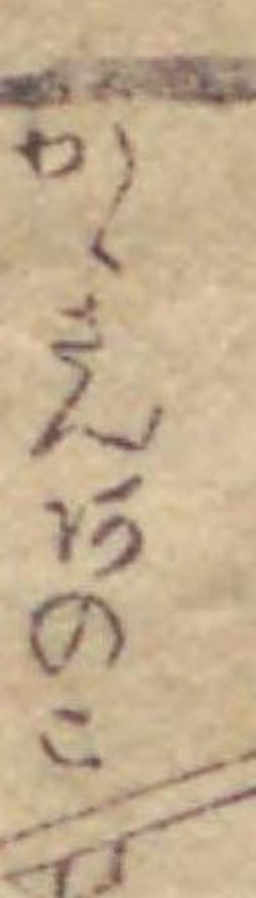かゝさんあのこ
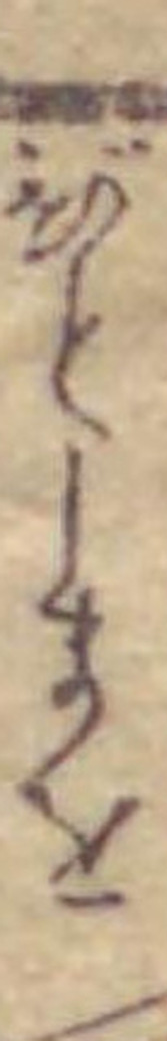びとしまを
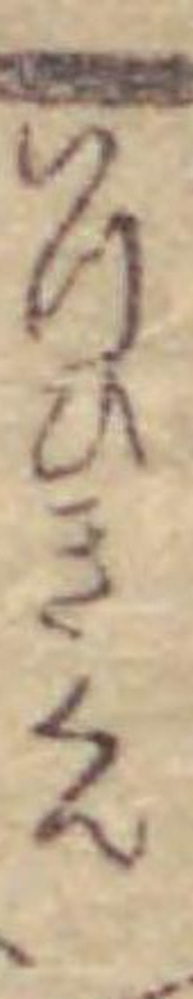いつひきくん
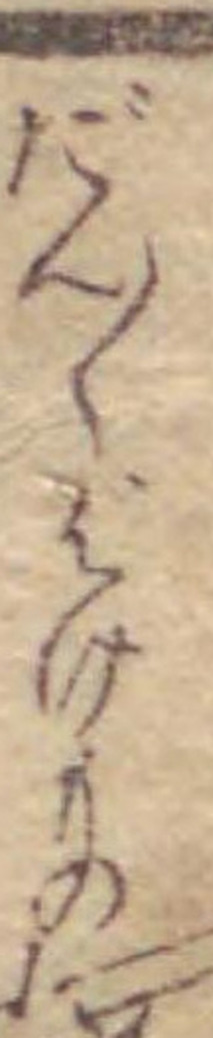だん〳〵ばけもの
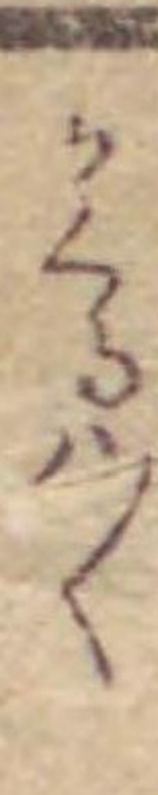かくるは〳〵
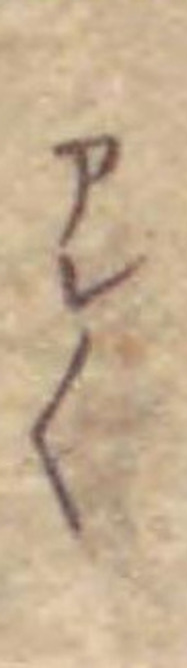アレ〳〵
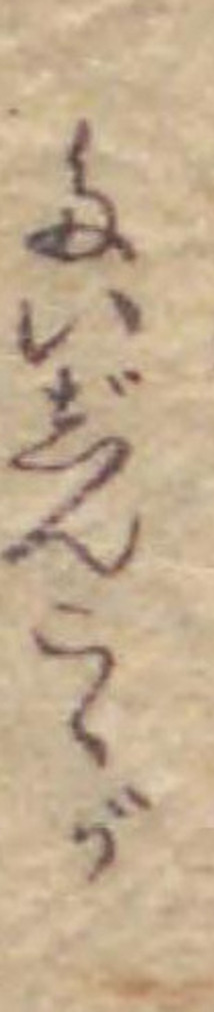たいじんこくが
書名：天下一面鏡梅鉢 : 3巻
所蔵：国立国会図書館 National Diet Library, JAPAN
